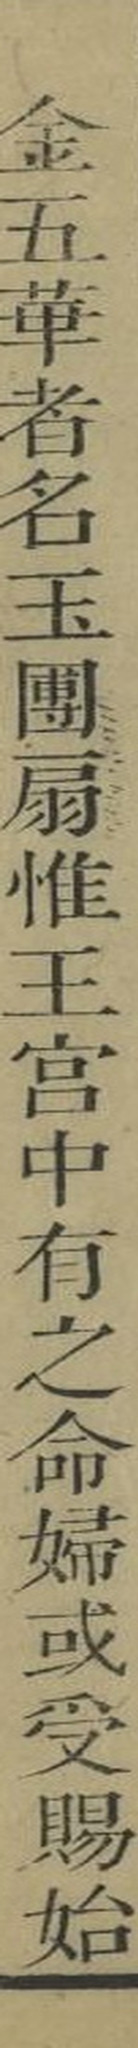金五華者名玉団扇惟王宮中有之命婦或受賜始
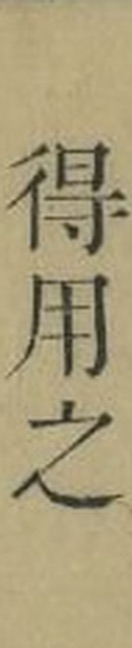得用之
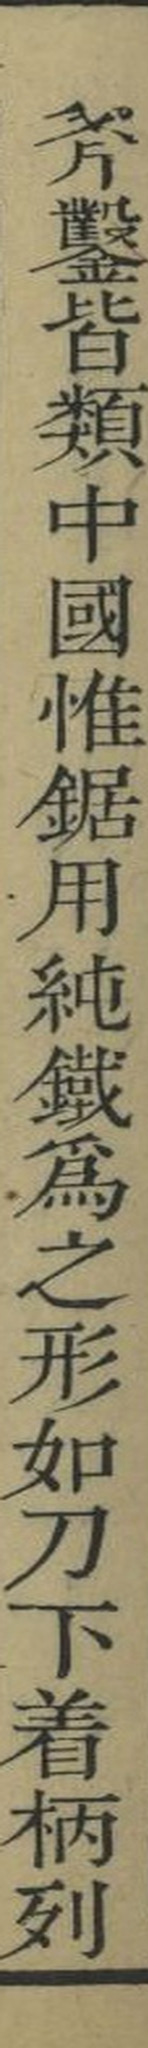斧鑿皆類中国惟鋸用純鉄為之形如刀下着柄列
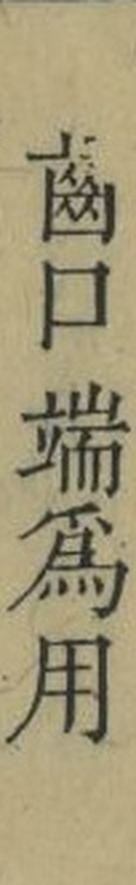歯口端為用

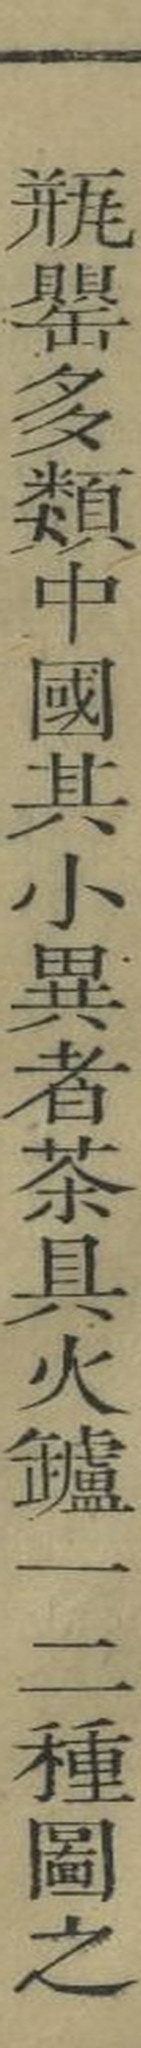瓶罌多類中国其小異者茶具火罏一二種図之
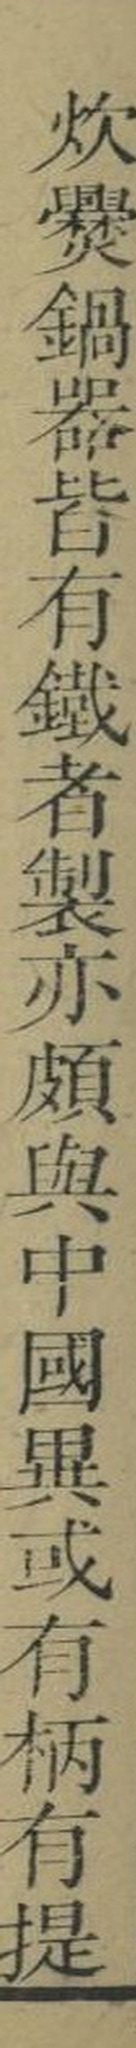炊爨鍋器皆有鉄者製亦頗与中国異或有柄有提
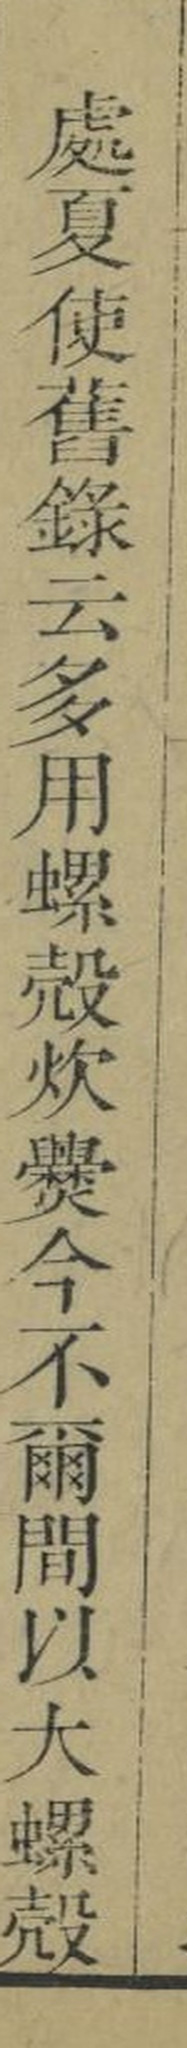処夏使旧録云多用螺殻炊爨今不爾間以大螺殻
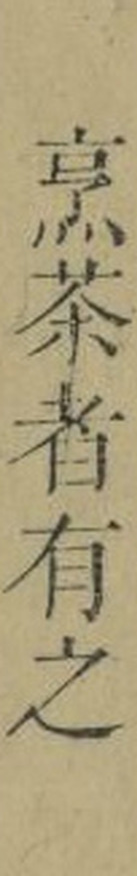烹茶者有之

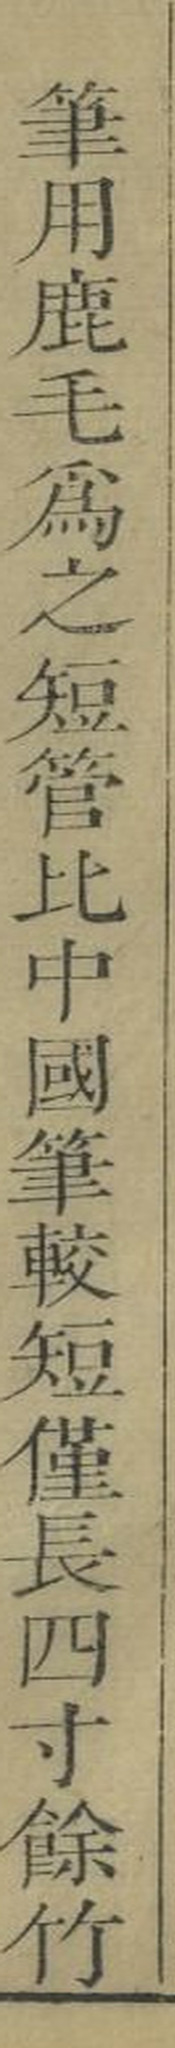筆用鹿毛為之短管比中国筆較短僅長四寸余竹
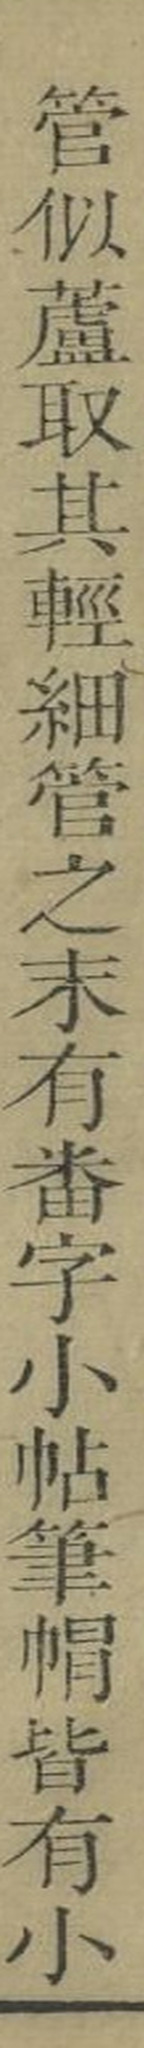管似蘆取其軽細管之末有番字小帖筆帽皆有小
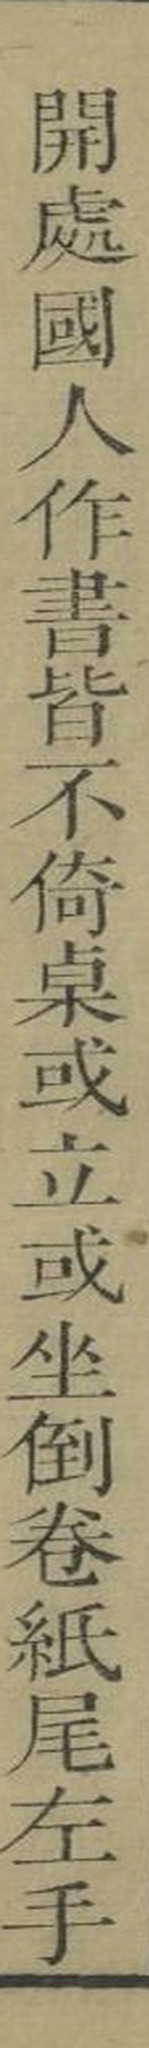開処国人作書皆不倚桌或立或坐倒巻紙尾左手
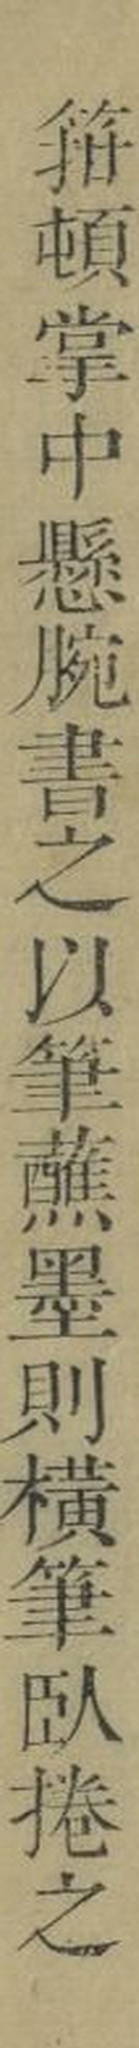箝頓掌中懸腕書之以筆蘸墨則横筆臥捲之
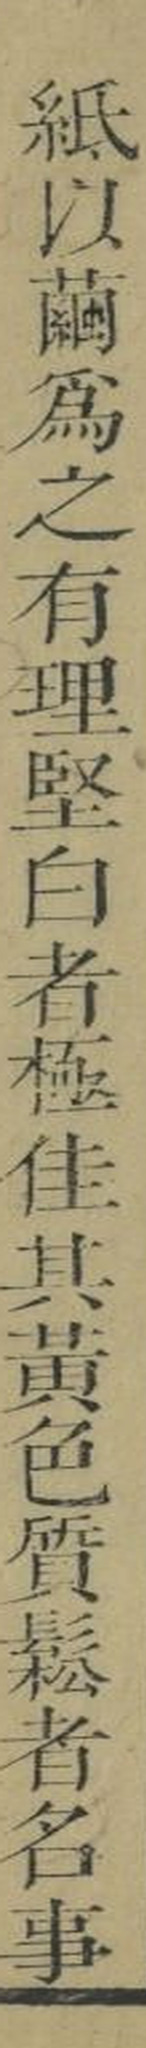紙以繭為之有理堅白者極佳其黄色質鬆者名事
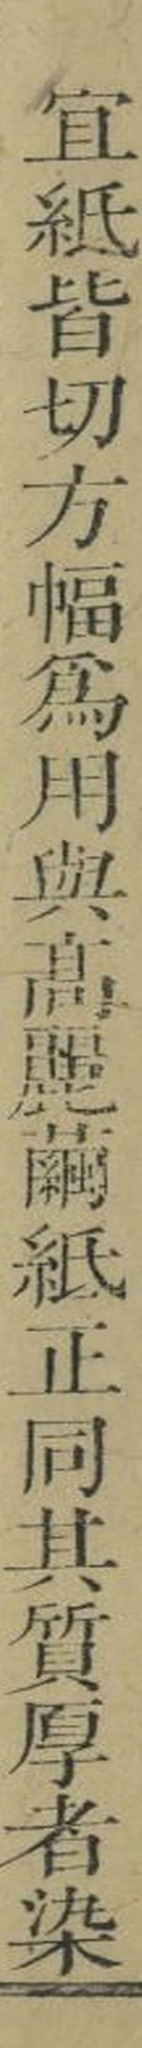宜紙皆切方幅為用与高麗繭紙正同其質厚者染
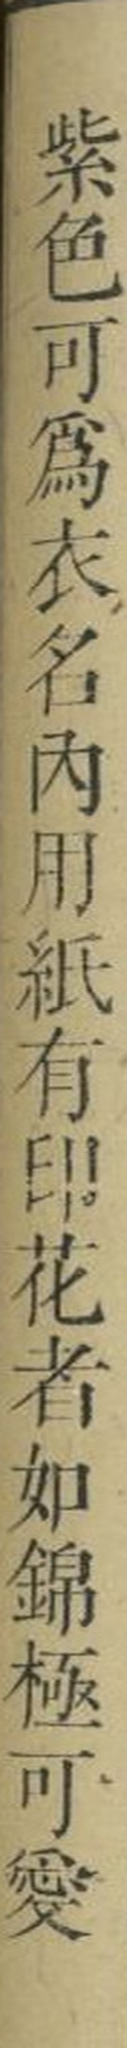紫色可為衣名内用紙有印花者如錦極可愛
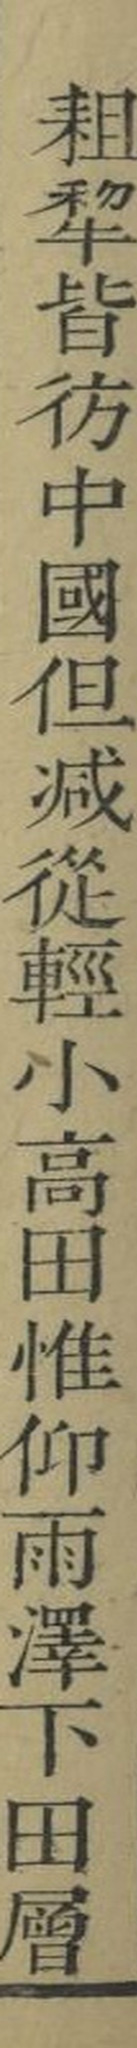耝犂皆彷中国但減従軽小高田惟仰雨沢下田層
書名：中山伝信録 巻六
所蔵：University of the Ryukyus Library
